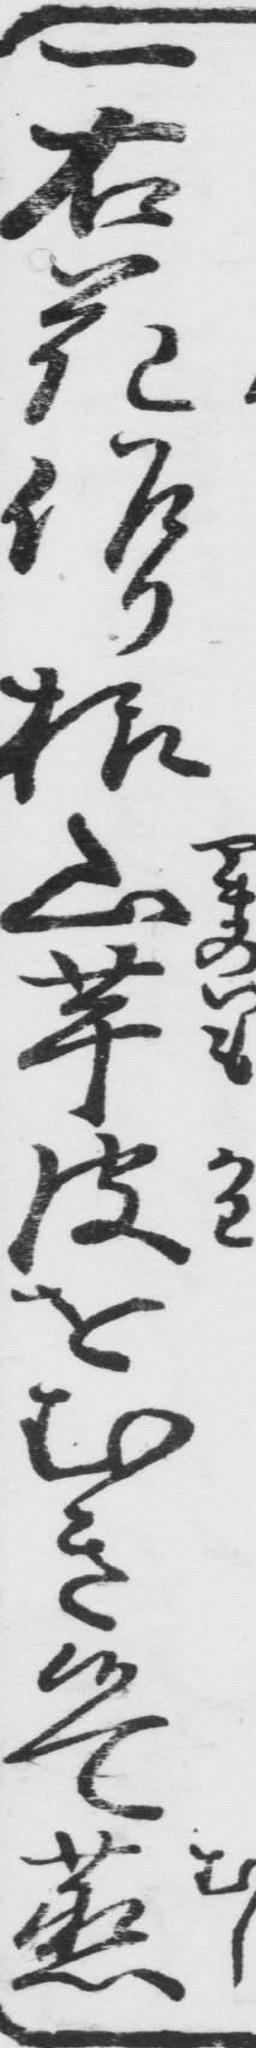一右花作り様山芋皮をむき候て蒸
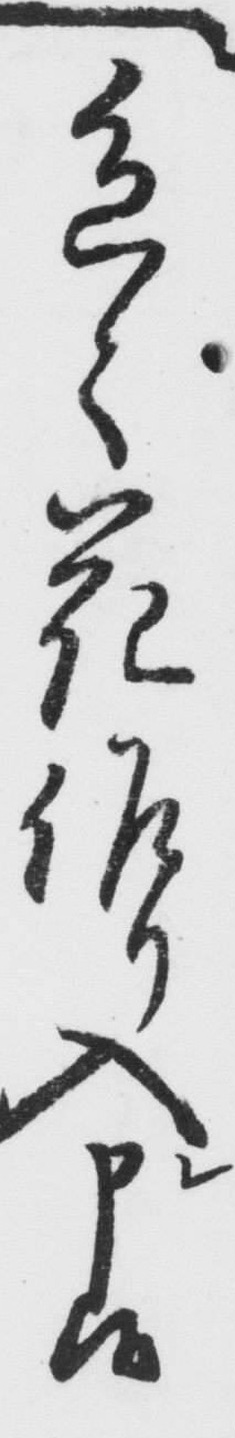色々花作り入れ申候
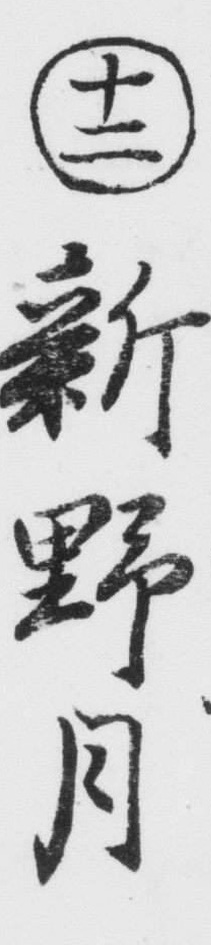(十二)新野月
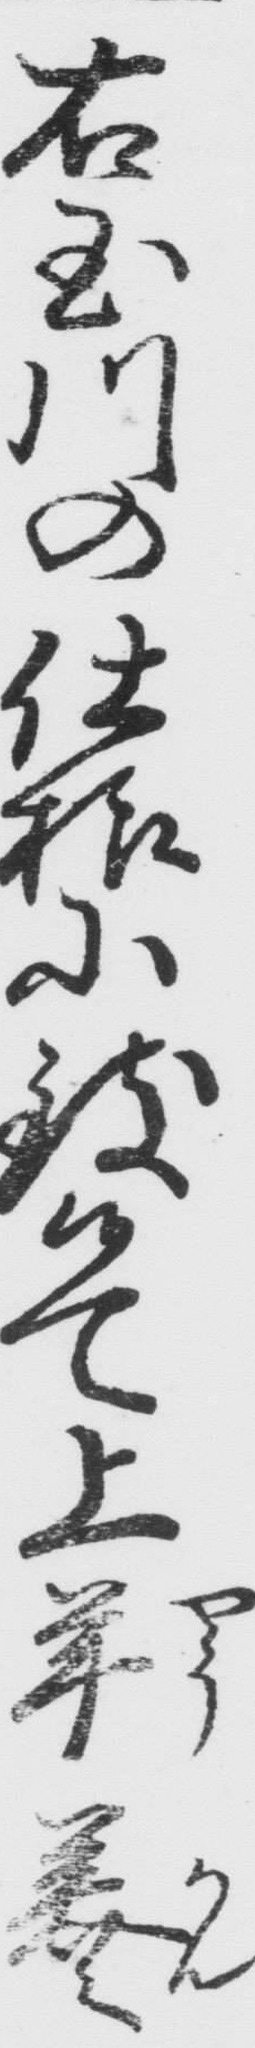右玉川の仕様に致候て上羊羹
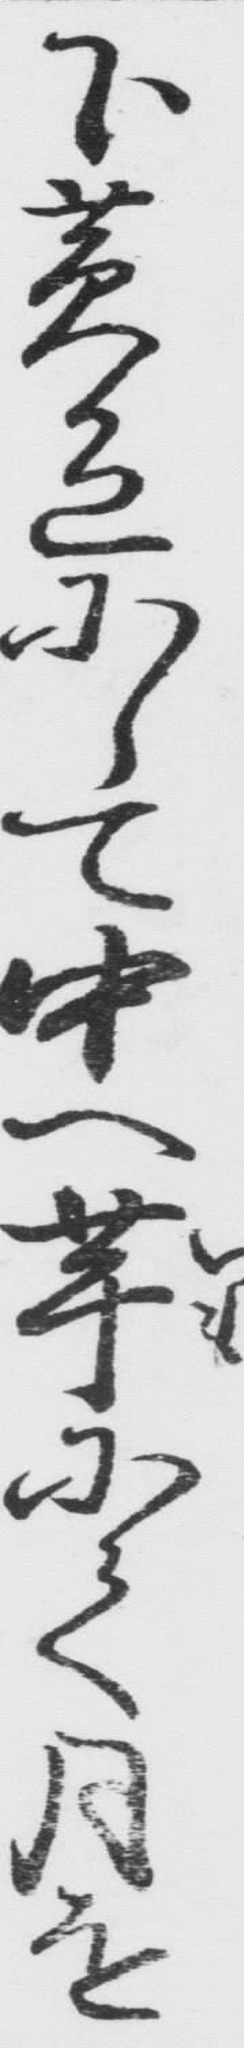下黄色にして中へ芋にて月を
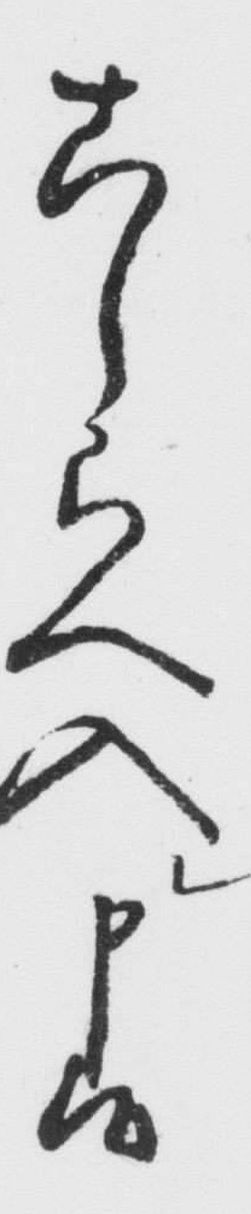こしらへ入れ申候

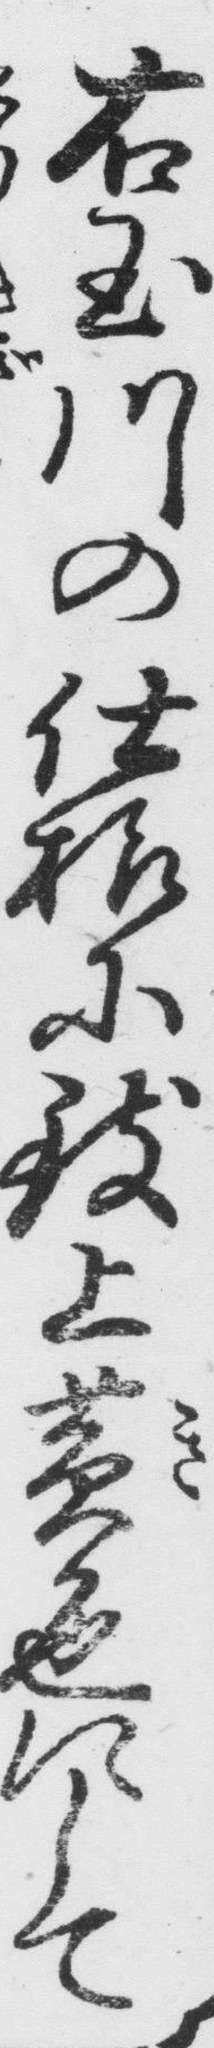右玉川の仕様に致上黄色にして
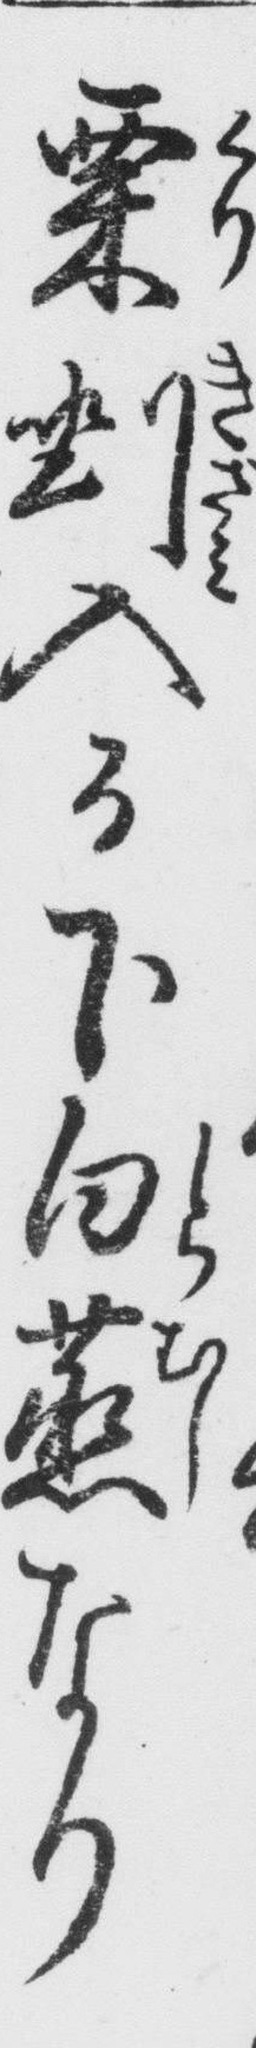栗刻入る下白蒸なり
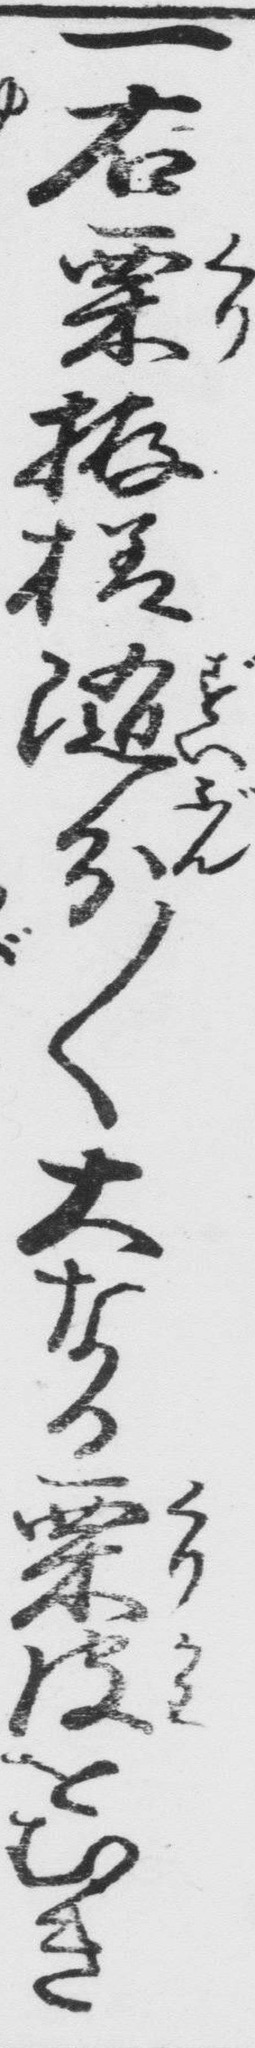一右栗拵様随分〳〵大なる栗皮をむき
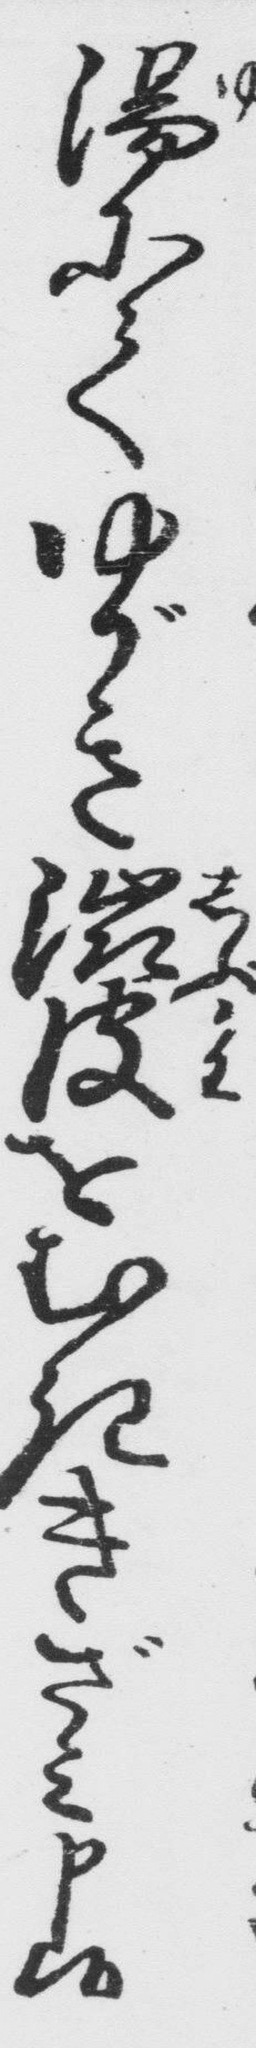湯にてゆがき渋皮をむききざみ申候
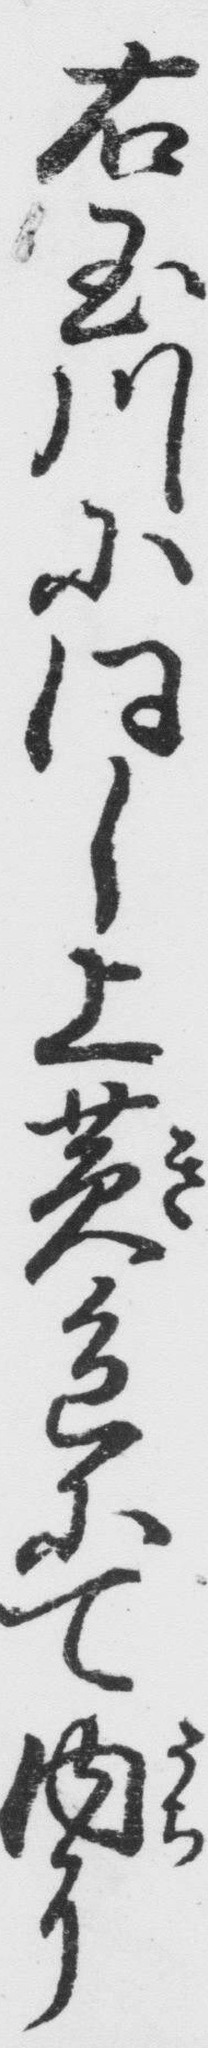右玉川に同し上黄色にて内に
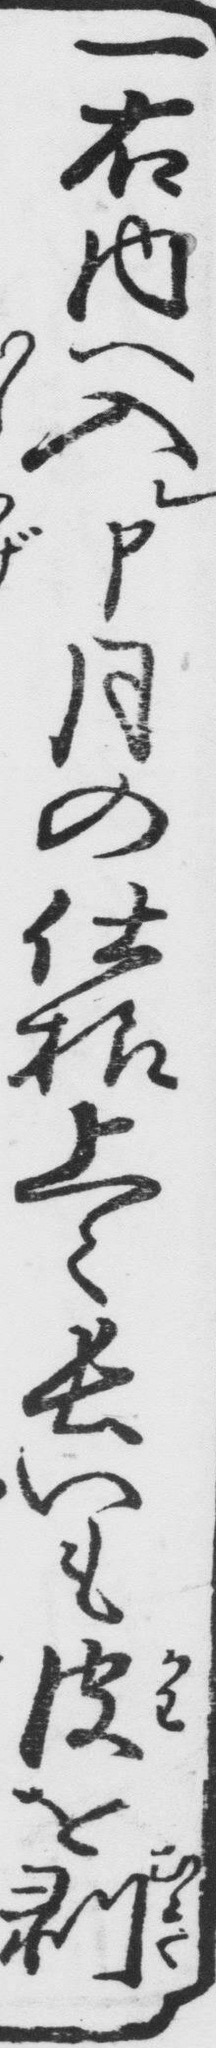一右内へ入れ申月の仕様上々長いも皮を剥
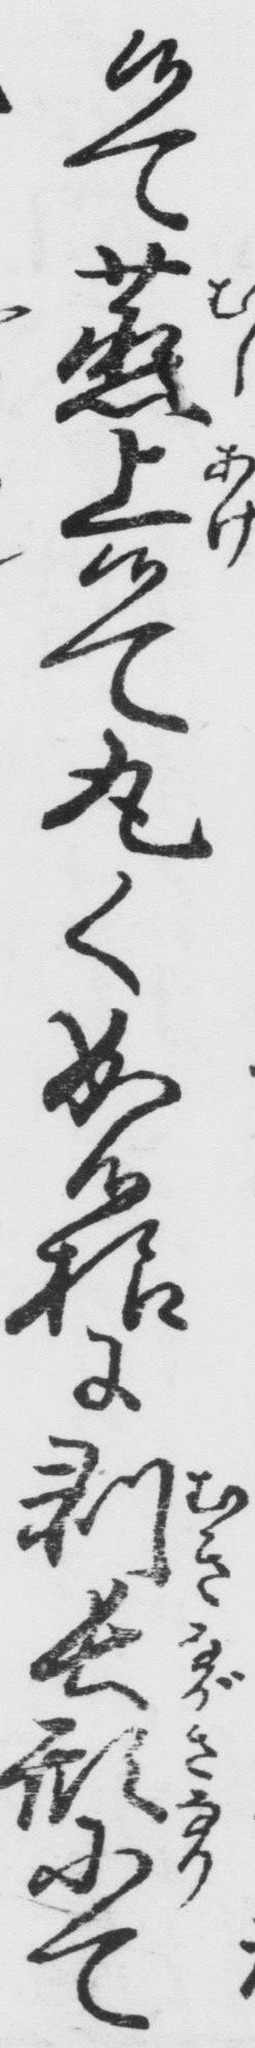候て蒸上候て丸く成候様に剥長形にて
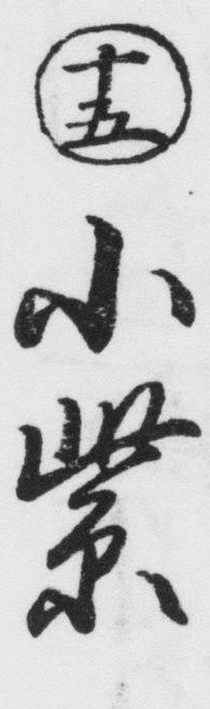(十五)小紫
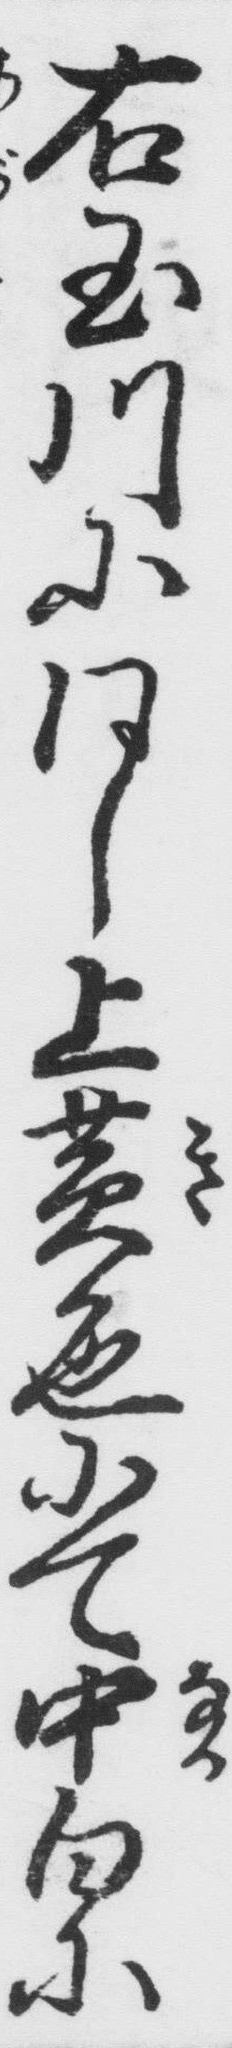右玉川に同し上黄色にて中白に
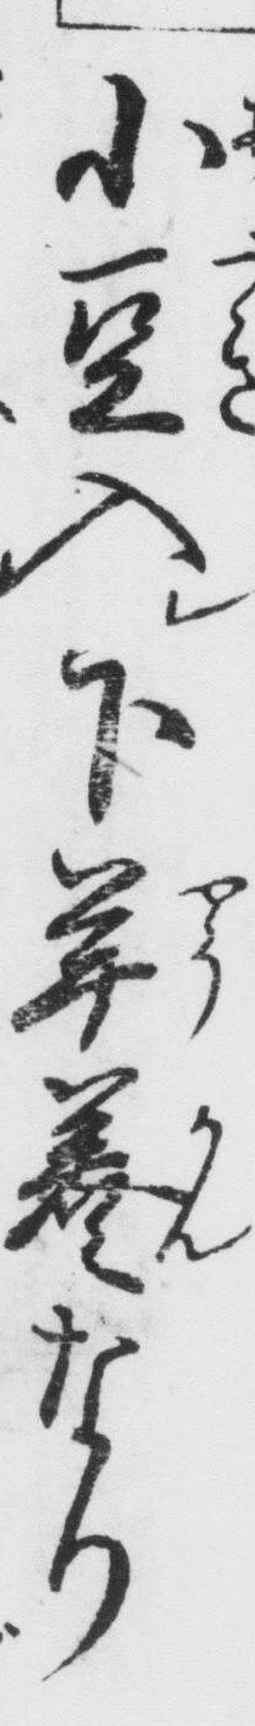小豆入れ下羊羹なり
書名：御前菓子図式
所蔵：大阪府立大学学術情報センター 国文学研究資料館
